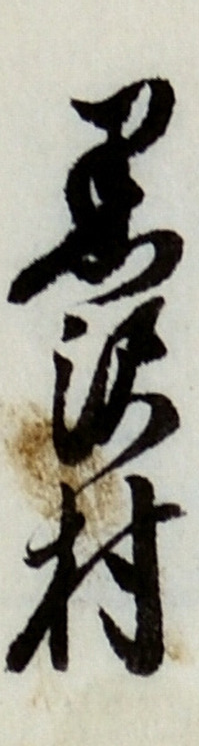黒沢村
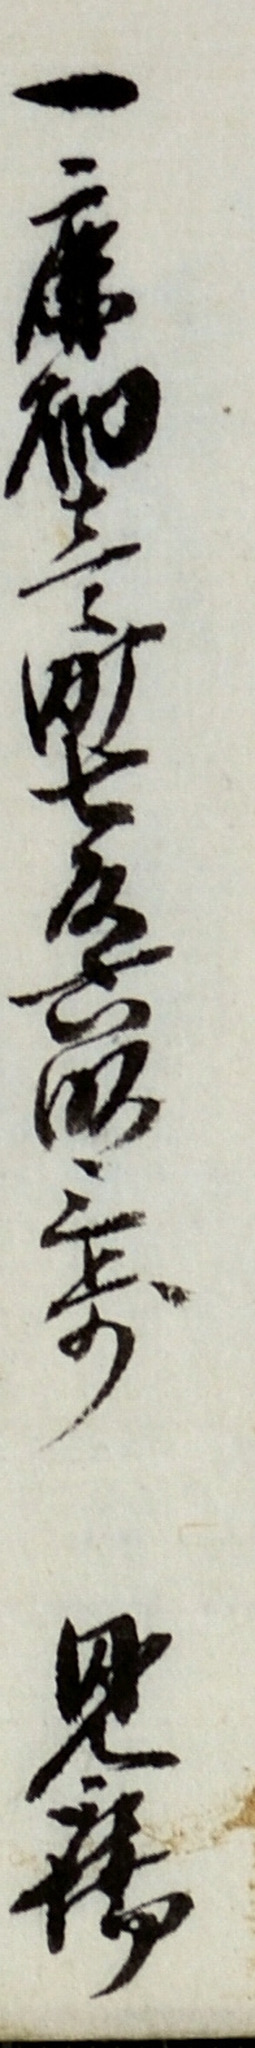一麻畑壱町七反六畝三歩見取場
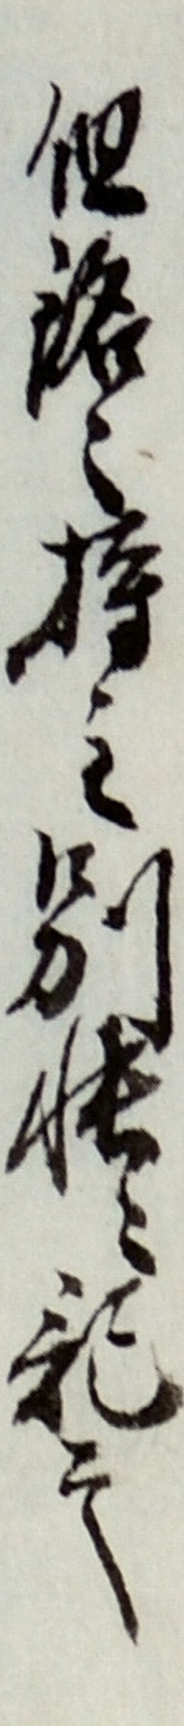但銘々持主別帳ニ記之
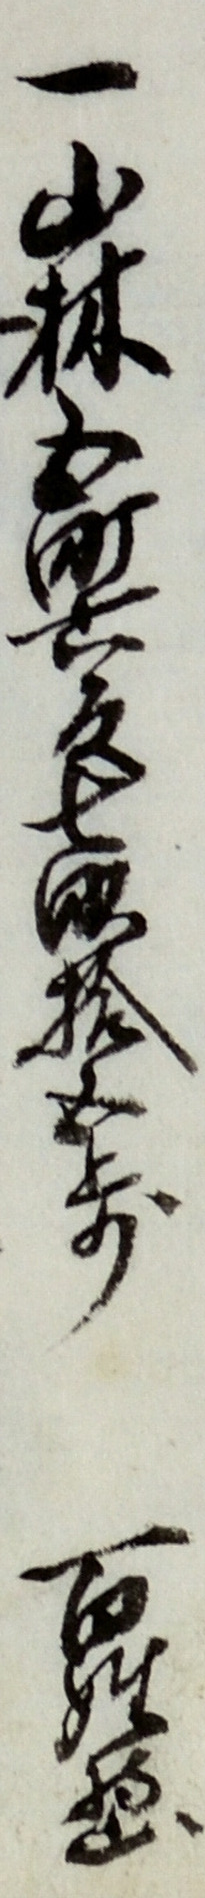一山林五町六反七畝拾五歩百姓持山
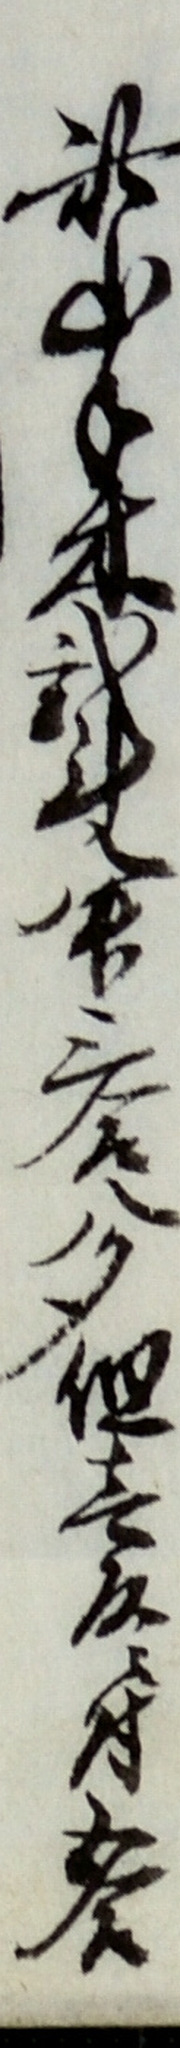此山手米弐斗八升三合八夕但壱反ニ付五合
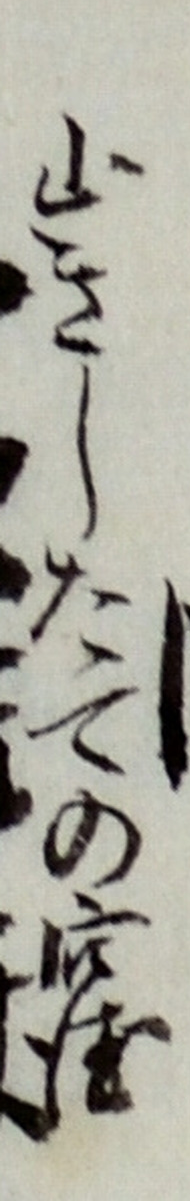山きしたての窪

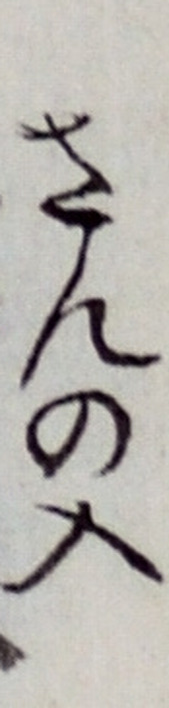さんの入
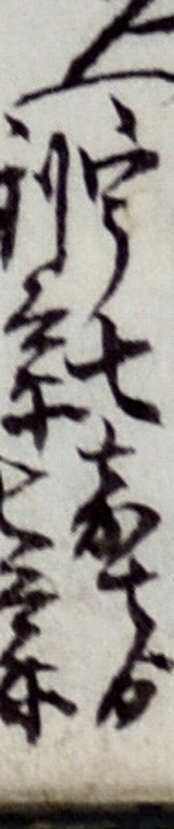宇七嘉七郎
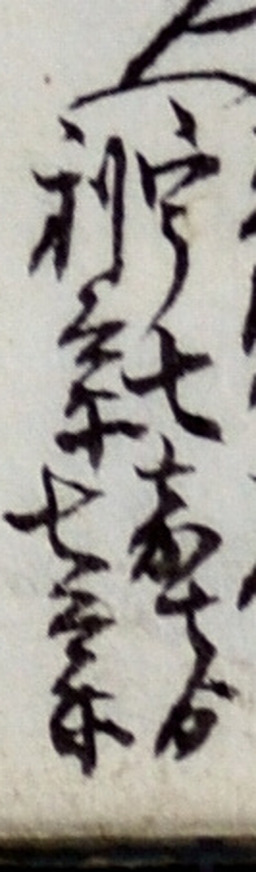角兵衛
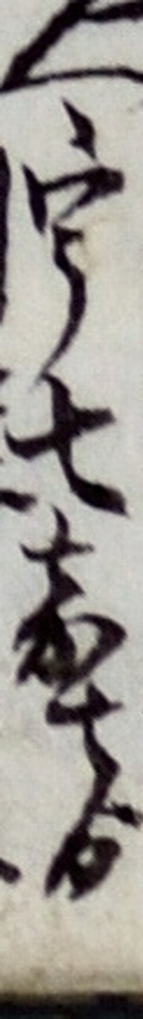宇七嘉七郎
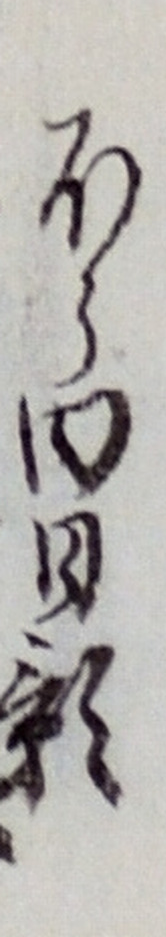ほら田日影
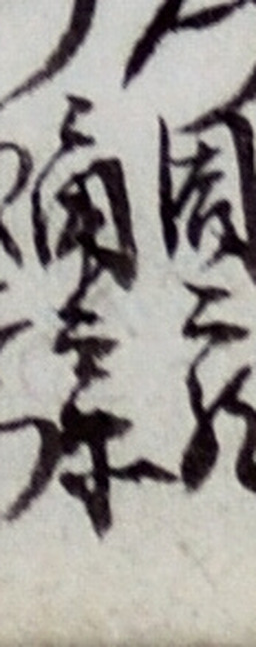角兵衛
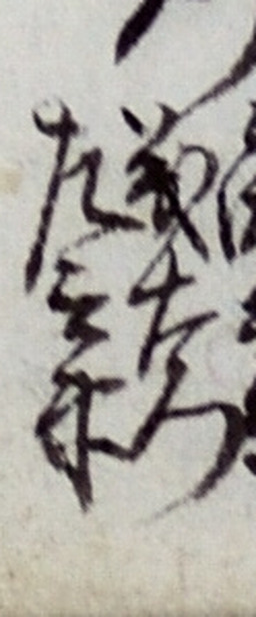左兵衛
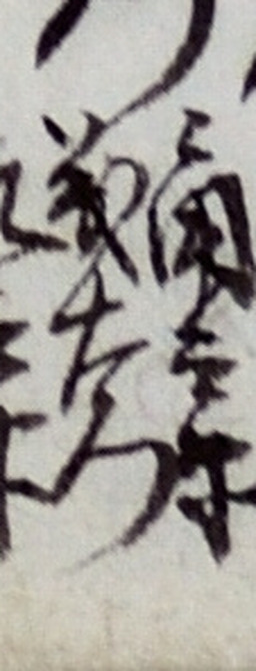伊右衛門
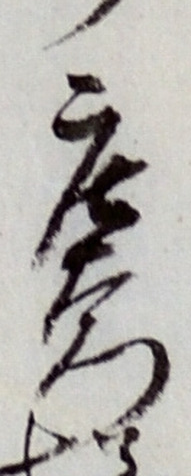伊右衛門
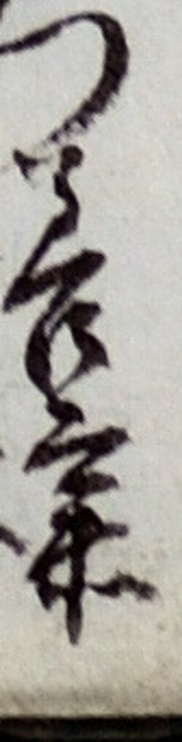角兵衛
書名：御領分中山林社地手控
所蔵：伊那市立高遠町図書館・合同会社AMANE
